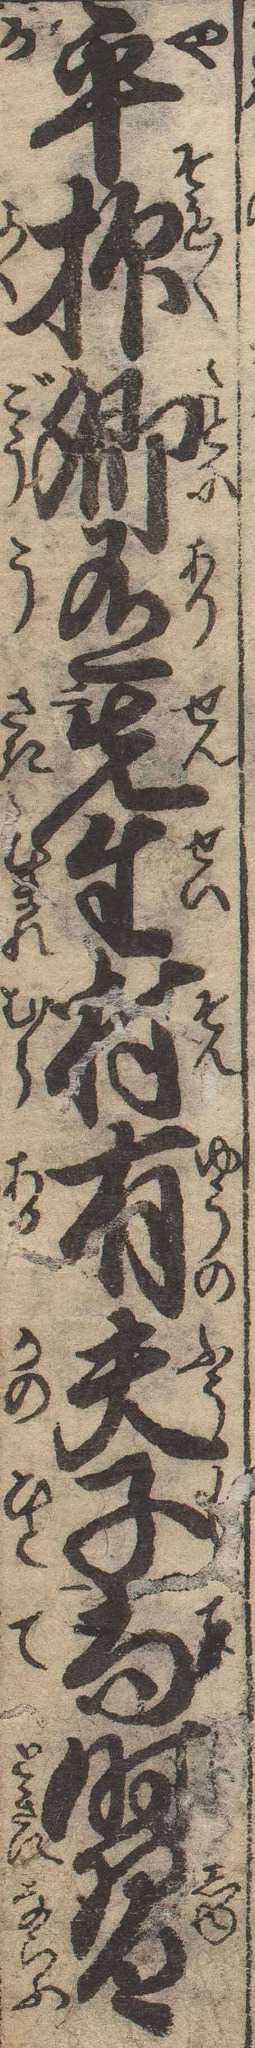乎抑郷有先生村有夫子而時習

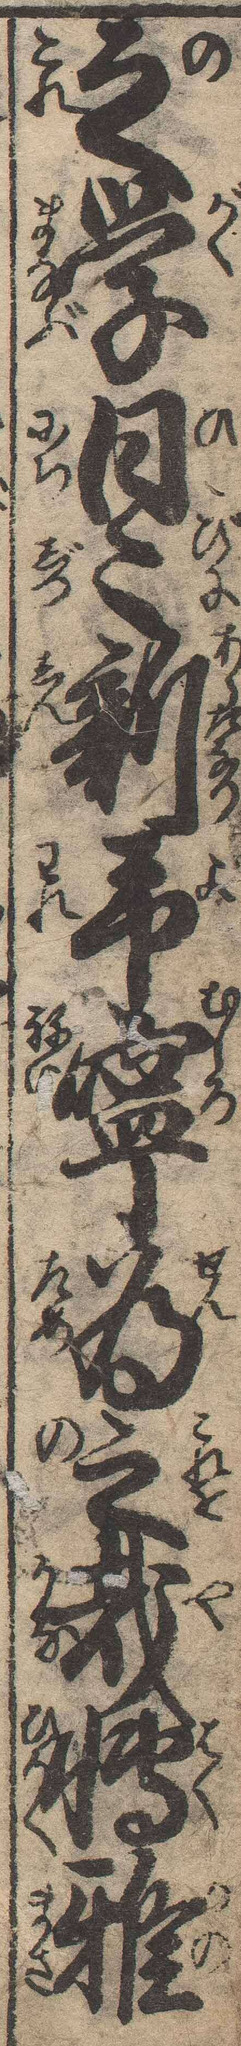之学日々新予寧為之哉博雅
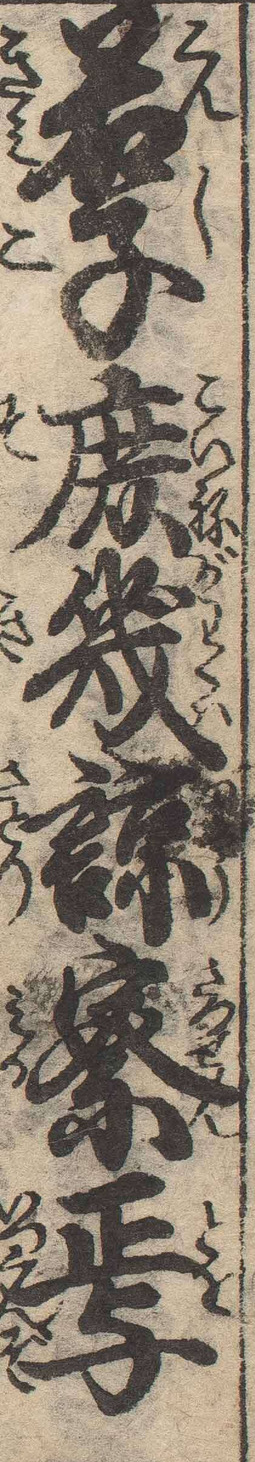君子庶幾諒察焉
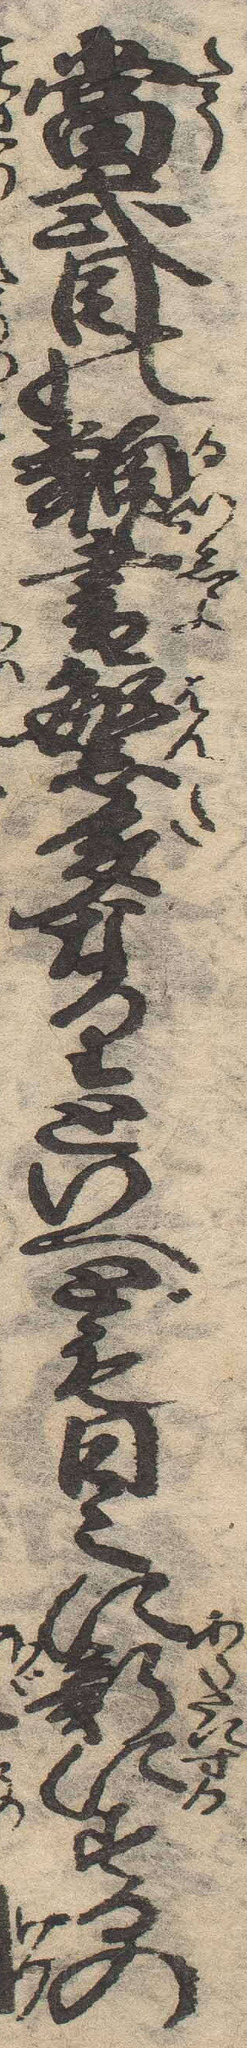當式目の類書繁多なりといへども日々に新にするの
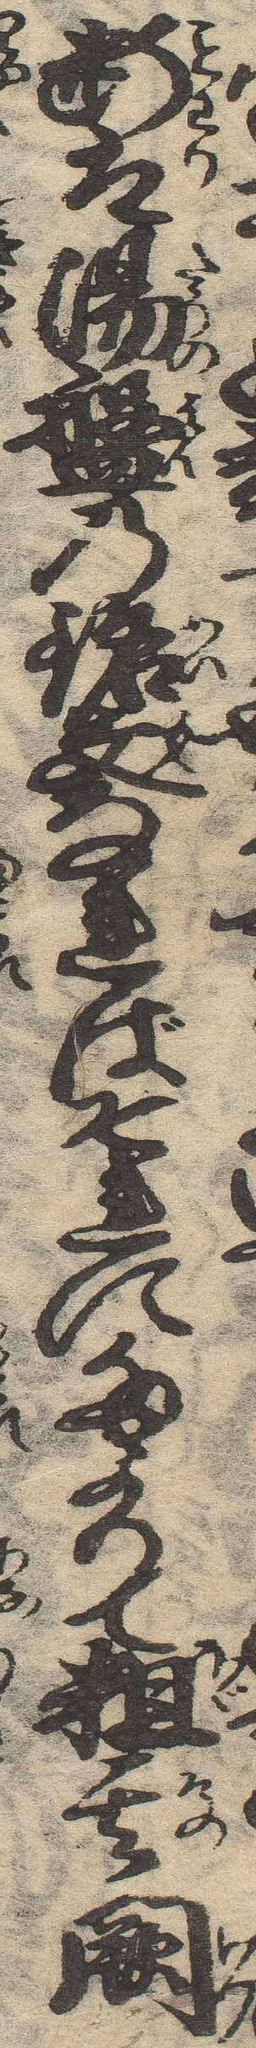断は湯盤の銘文なればそれにたよりて粗其闕
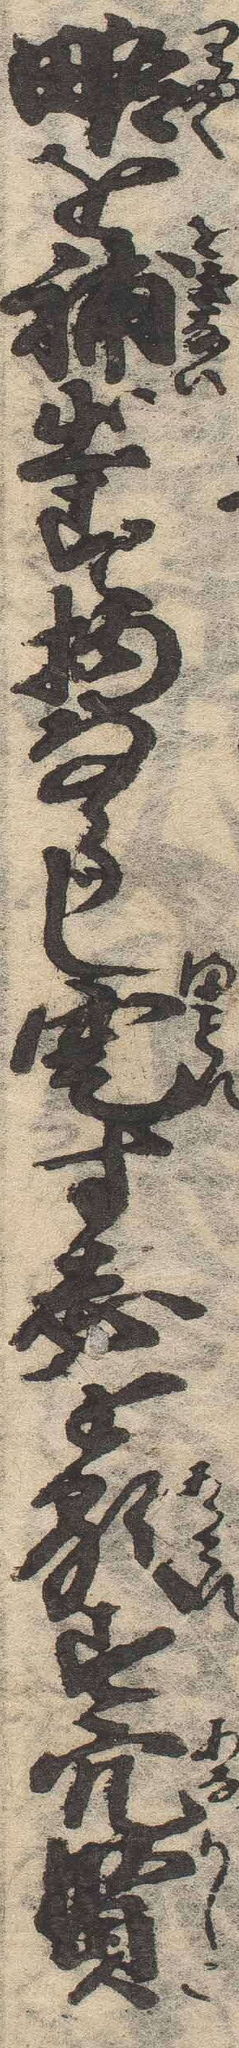略を補出す物なりし寔寸志を顕す穴賢
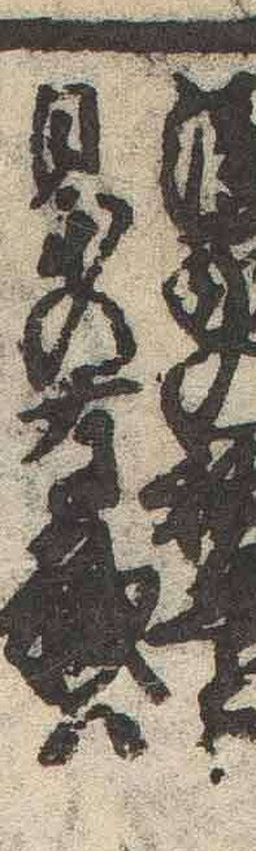日本の有職は
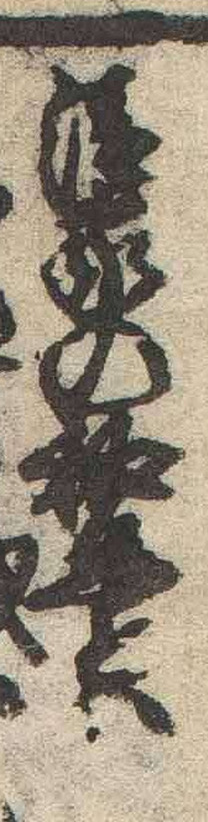清家の秘点とは
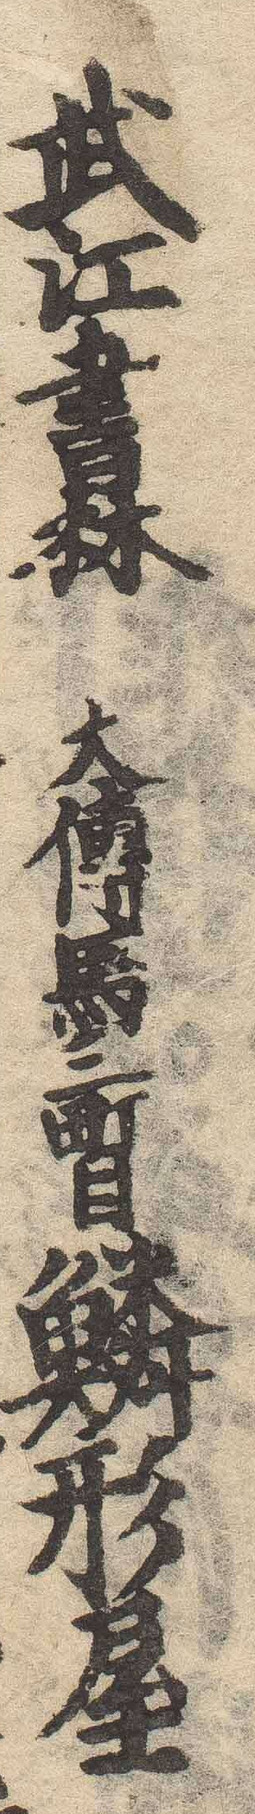武江書林大傳馬三町目鱗形屋
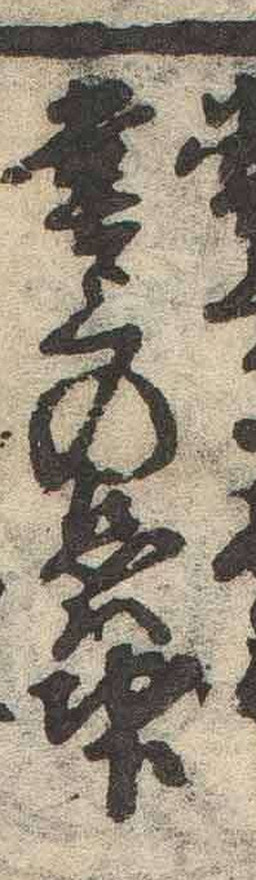堂上の点は地下
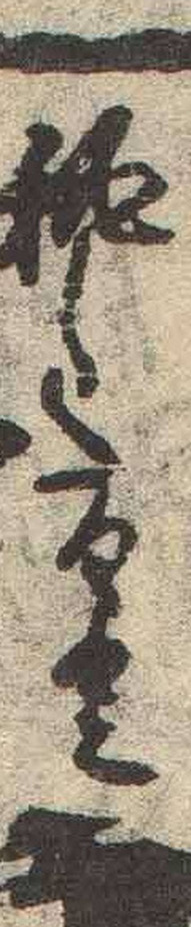秘したるよみ
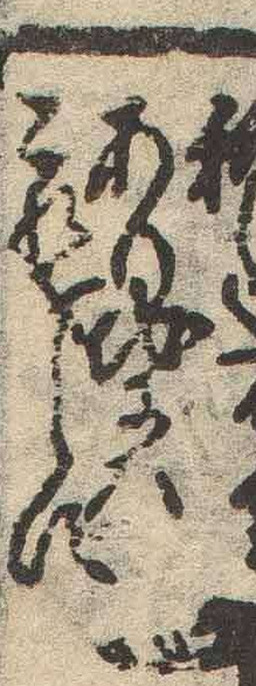あり地かは
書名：御成敗式目絵抄
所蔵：東京学芸大学附属図書館 国文学研究資料館
